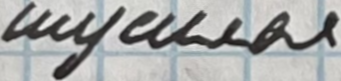тусклая
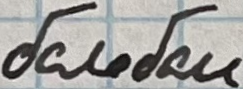балобан
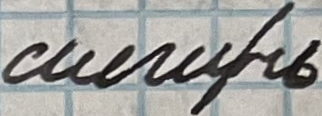снегирь
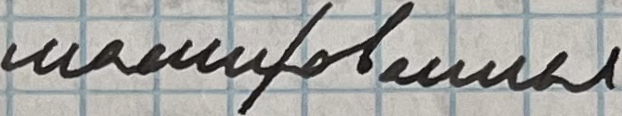маскированная
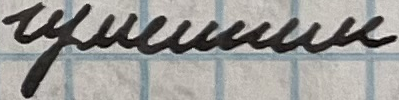гуменник
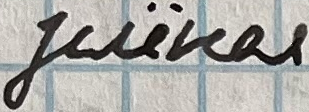зелёная
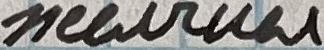желчная
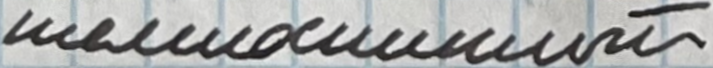темноспинный
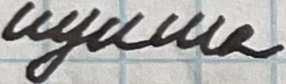кукша
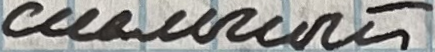скальный
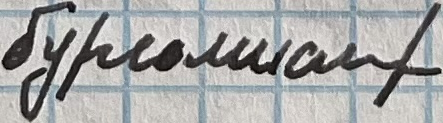бургомистр
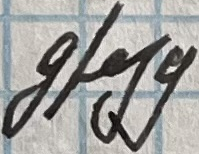дрозд
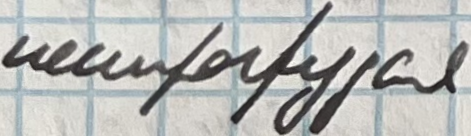пестрогрудая
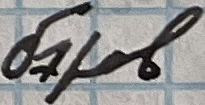бэров
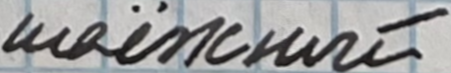таёжный
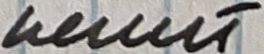пегий
